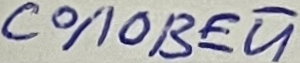соловей
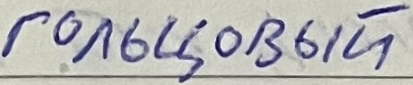гольцовый
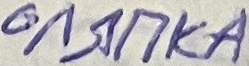оляпка
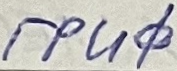гриф
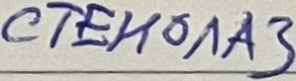стенолаз
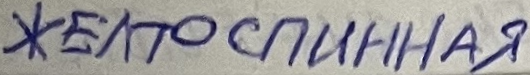желтоспинная
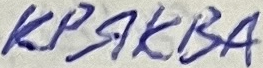кряква
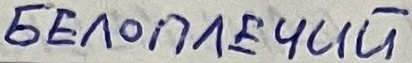белоплечий
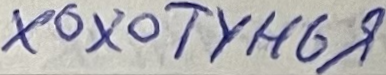хохотунья
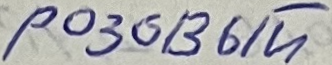розовый
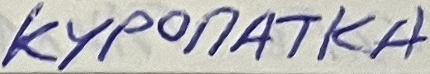куропатка
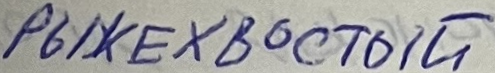рыжехвостый
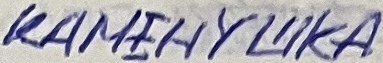каменушка
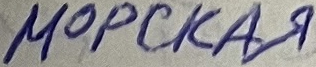морская
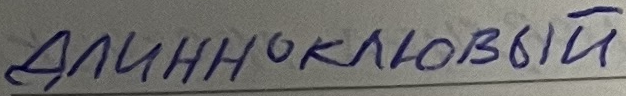длинноклювый
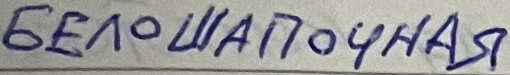белошапочная
